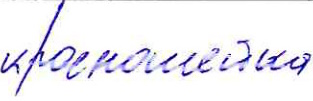кросношейка
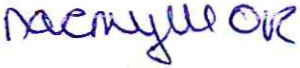пастушок
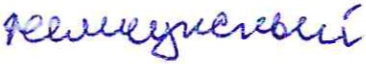жемчужный
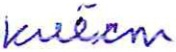клёст
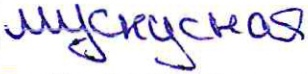мускусная
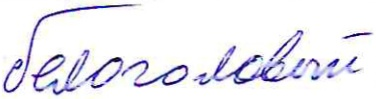белоголовый
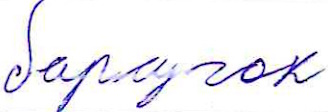барсучок
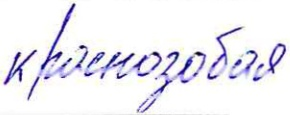краснозобая
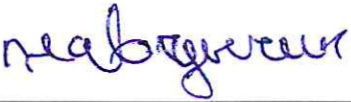плавунчик
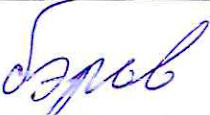бэров
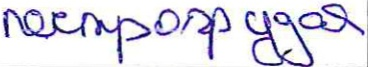пестрогрудая
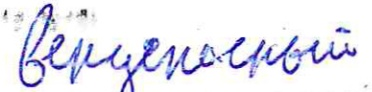венценосный
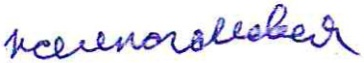желтоголовая
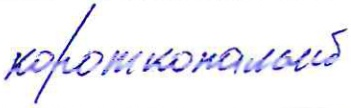короткопалый
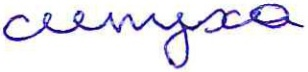сипуха
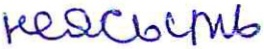неясыть
